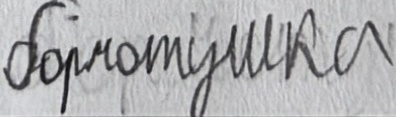бормотушка
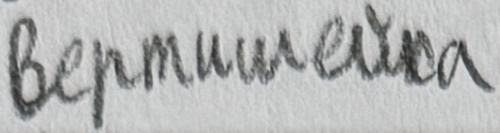вертишейка
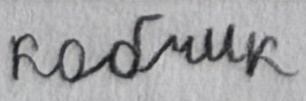кобчик
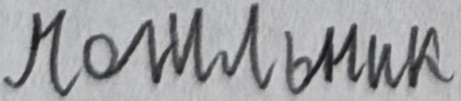могильник
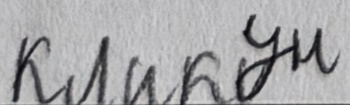кликун
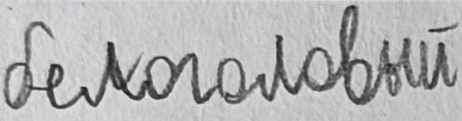белоголовый
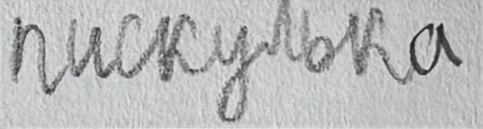пискулька
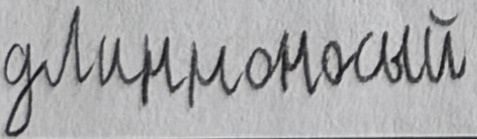длинноносый
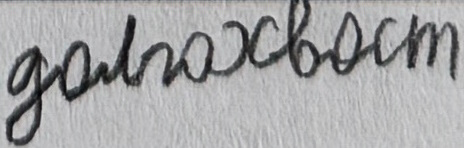долгохвост
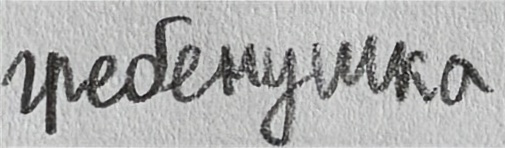гребенушка
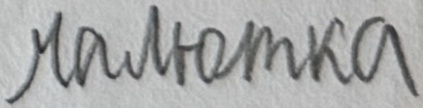малютка
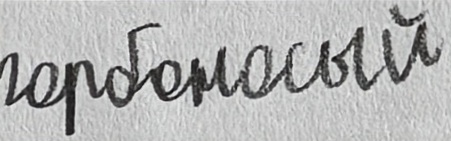горбоносый
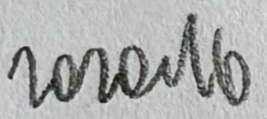гоголь
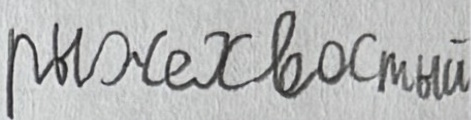рыжехвостый
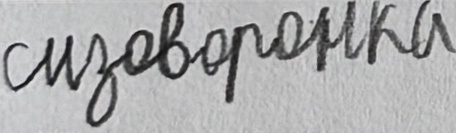сизоворонка
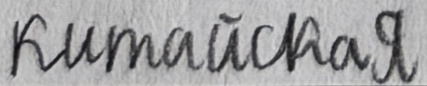китайская
